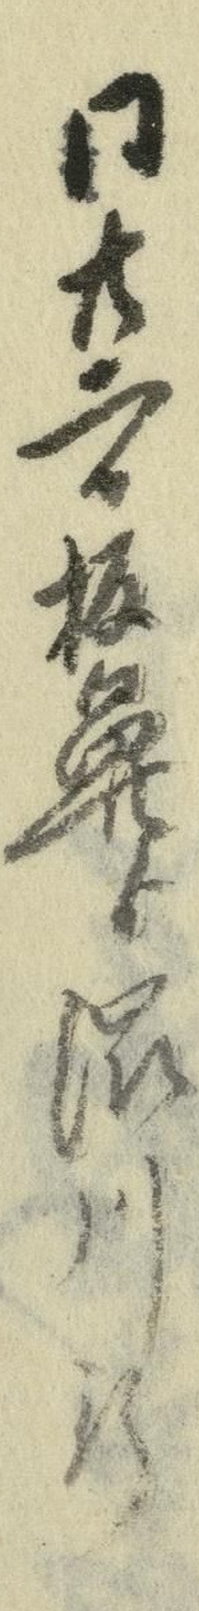同廿二日板鼻ゟ渋川行
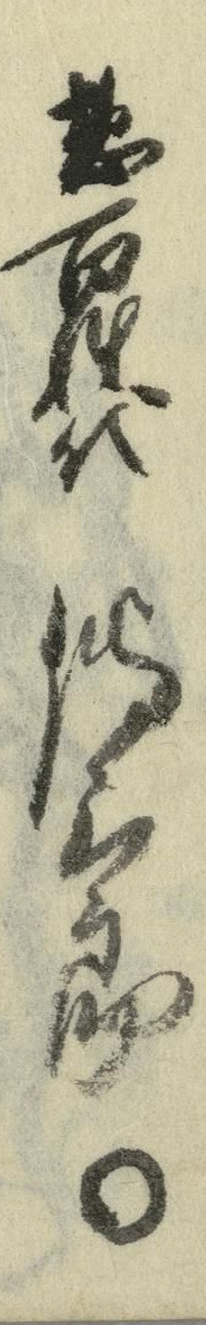惣百姓代伝三郎

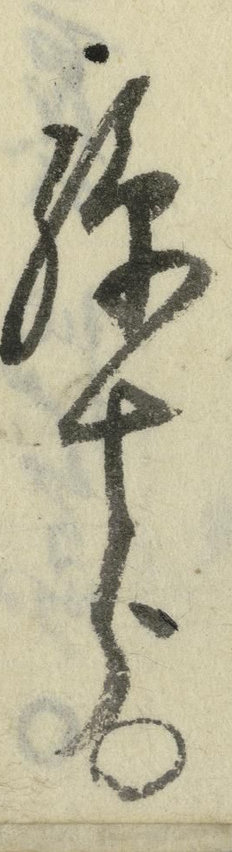孫十郎
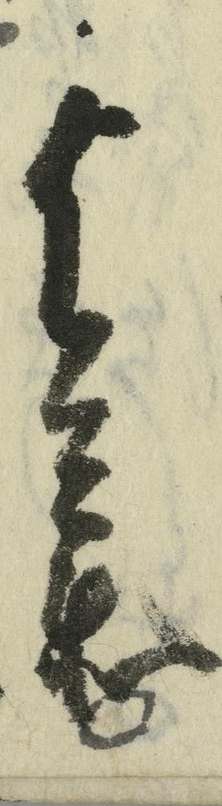与兵衛
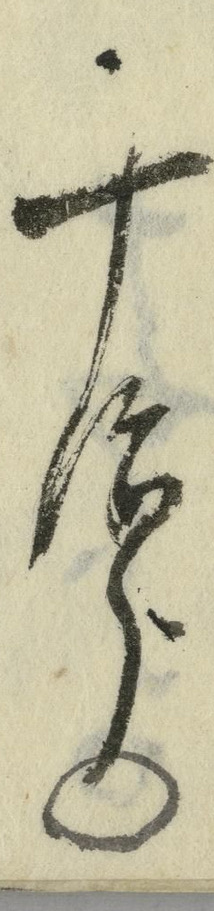十治郎
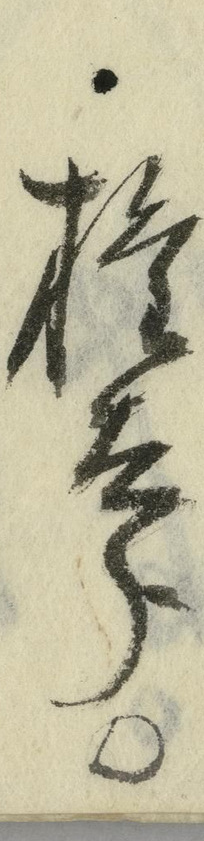権太郎
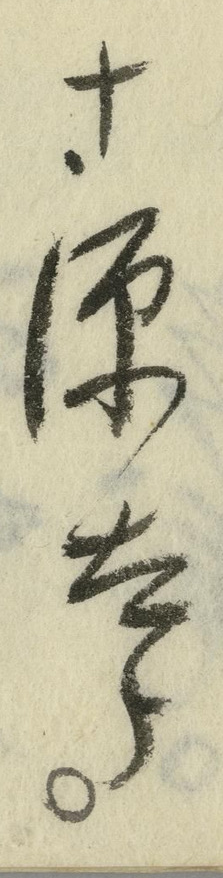十源太郎
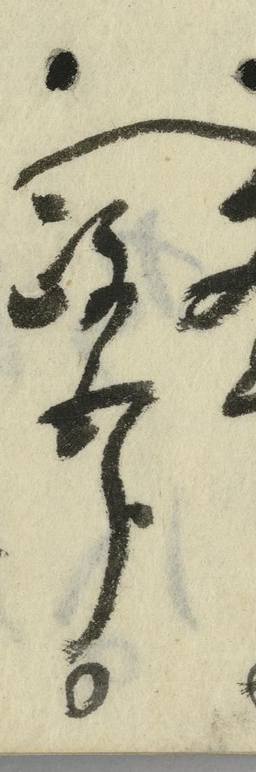●政五郎
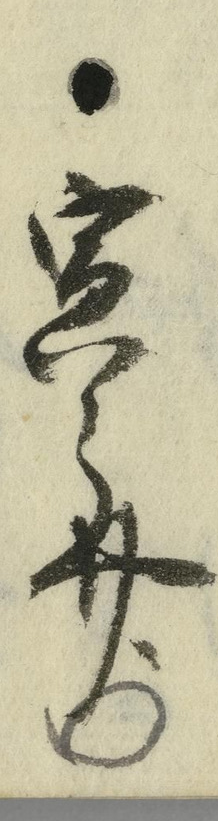●磯右衛門

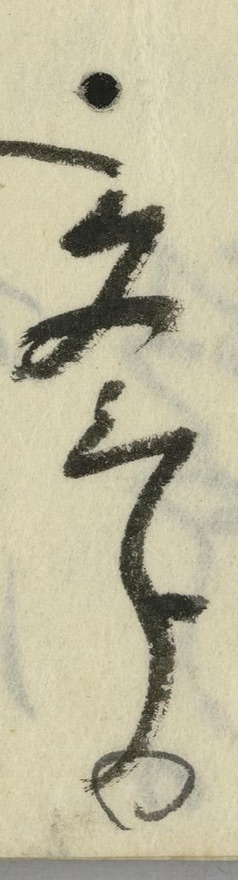金三郎
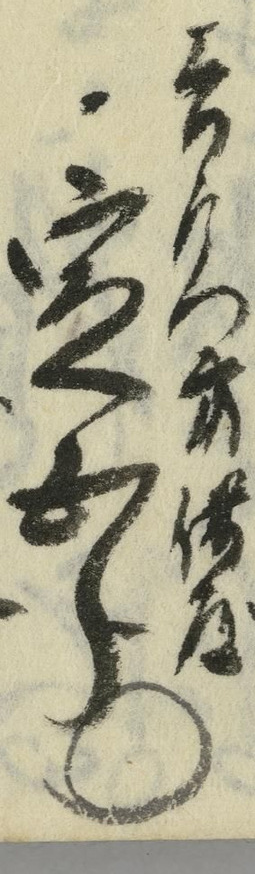定五郎
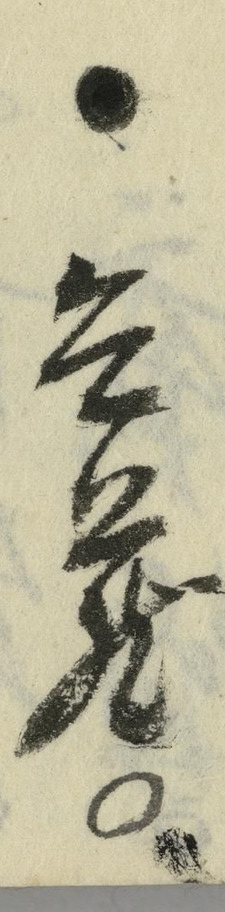●兵蔵
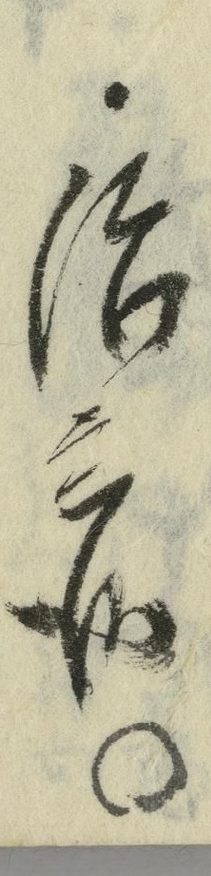治兵衛
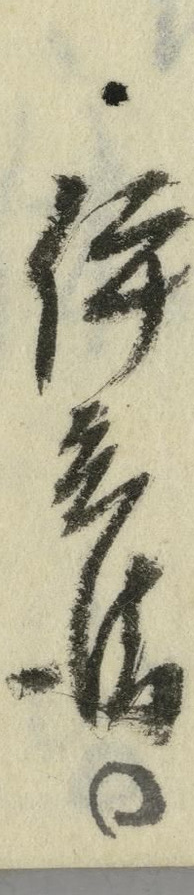伊兵衛
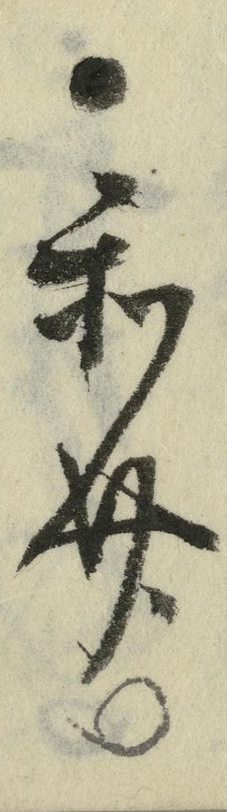●和介
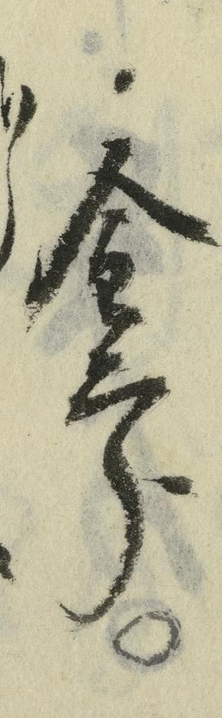金三郎
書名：天明淺間噴火ニ関スル書類
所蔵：東京大学地震研究所図書室 Earthquake Research Institute Library, The University of Tokyo, JAPAN
